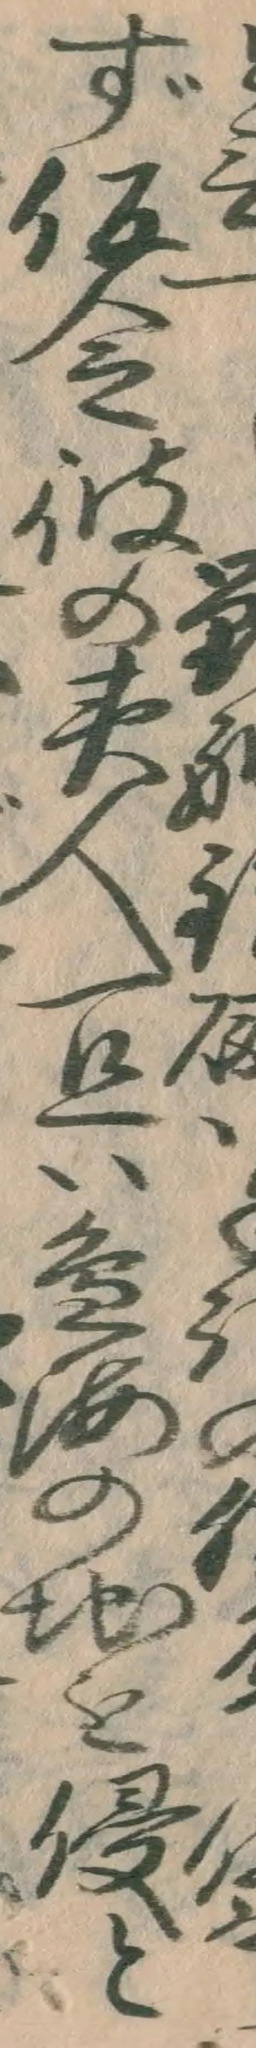ず仮令彼の夷人一旦ハ邊海の地を侵と
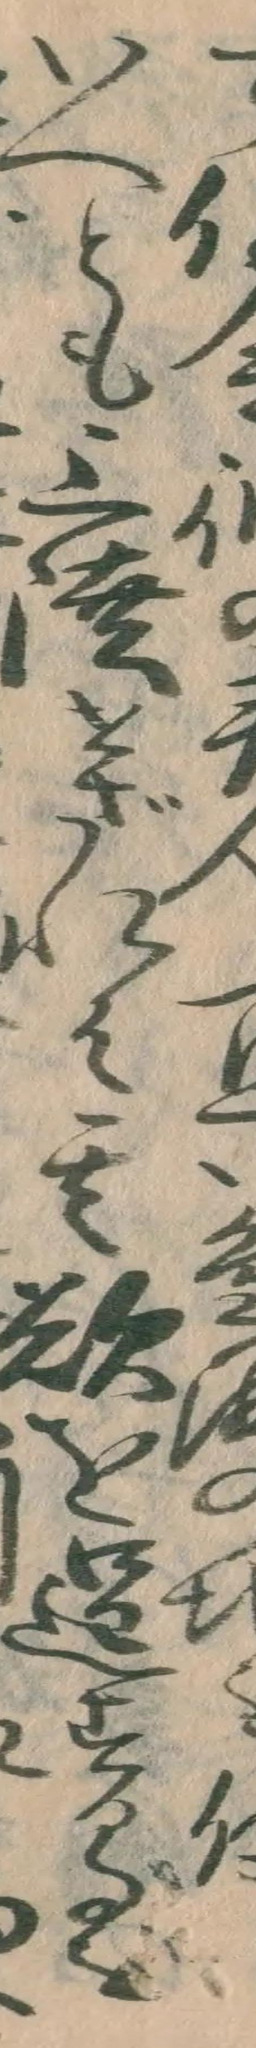いへとも上陸せざれ者其欲を逞する事を
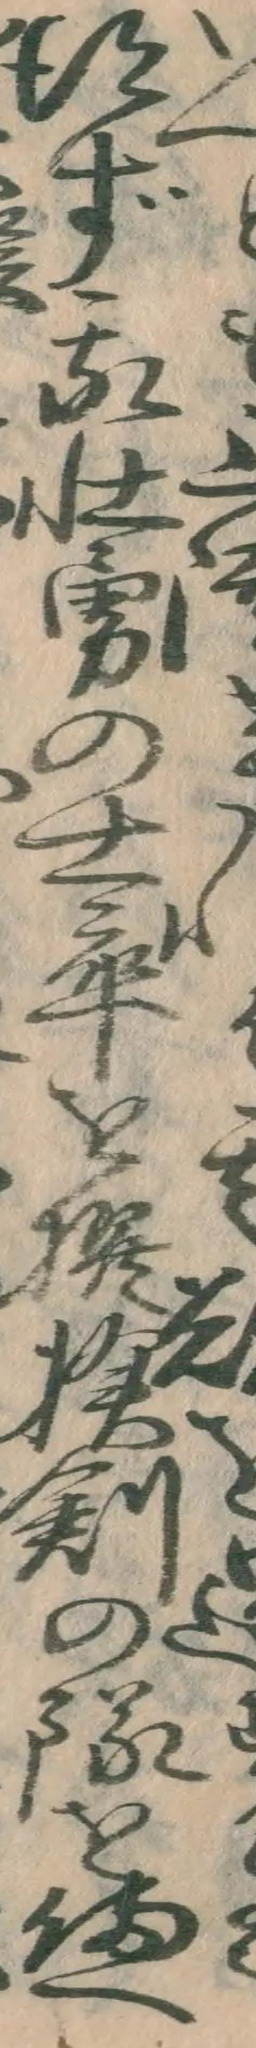得ず我壮勇の士卒を撰槍剣の隊を備へ
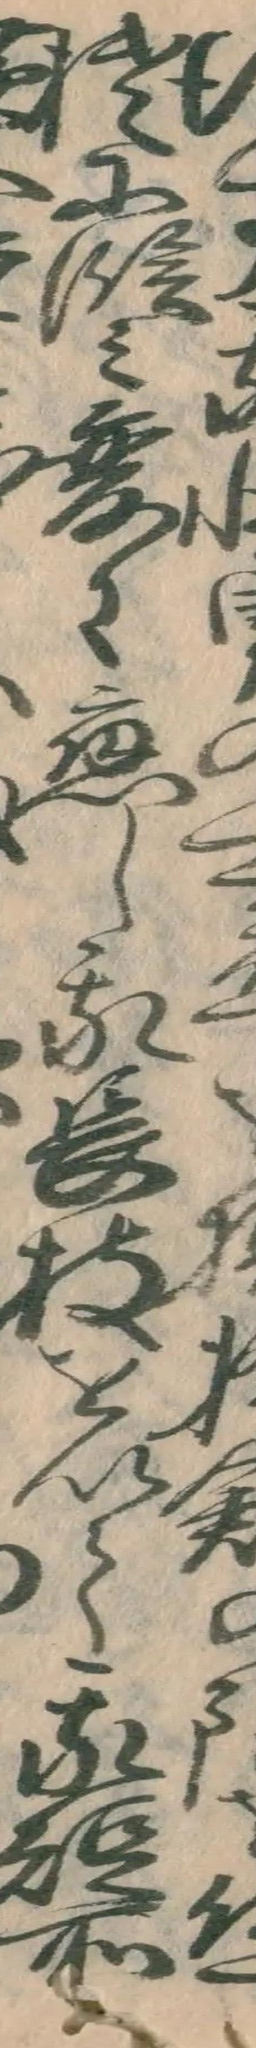機に臨ミ変に應し我長技を以て我短所
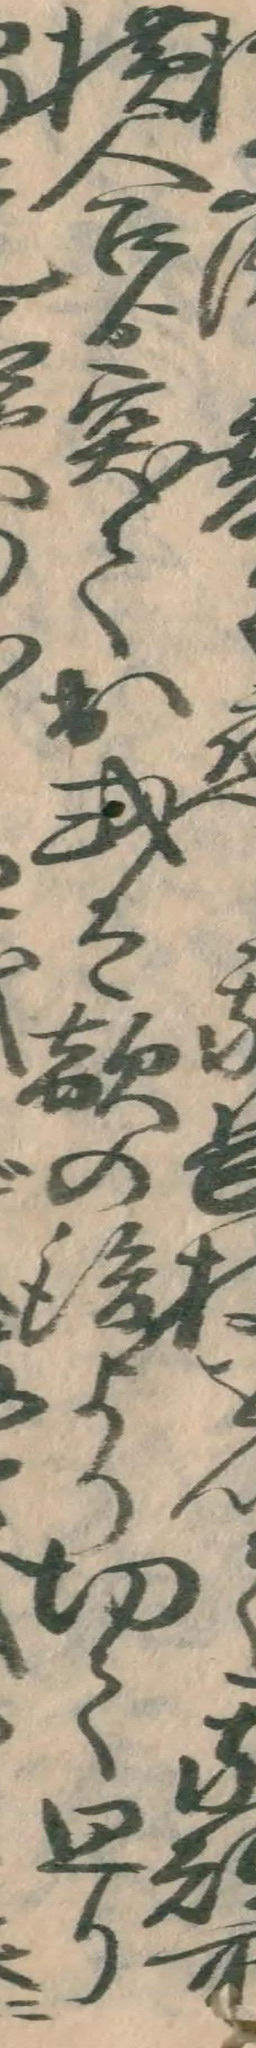横合ゟ突て出或は敵の後より切て廻り
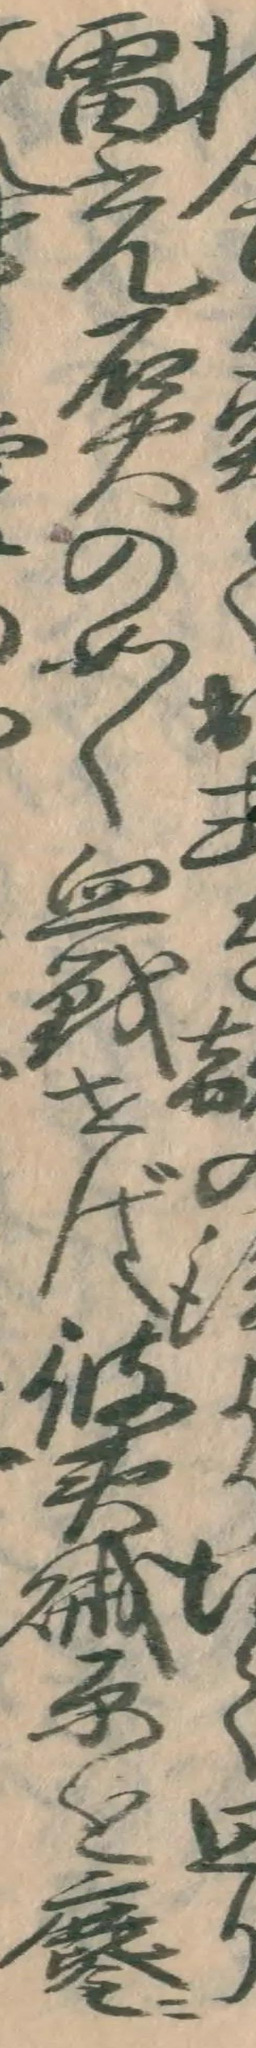雷光石火の如く血戦せば彼夷賊原を鏖ニ
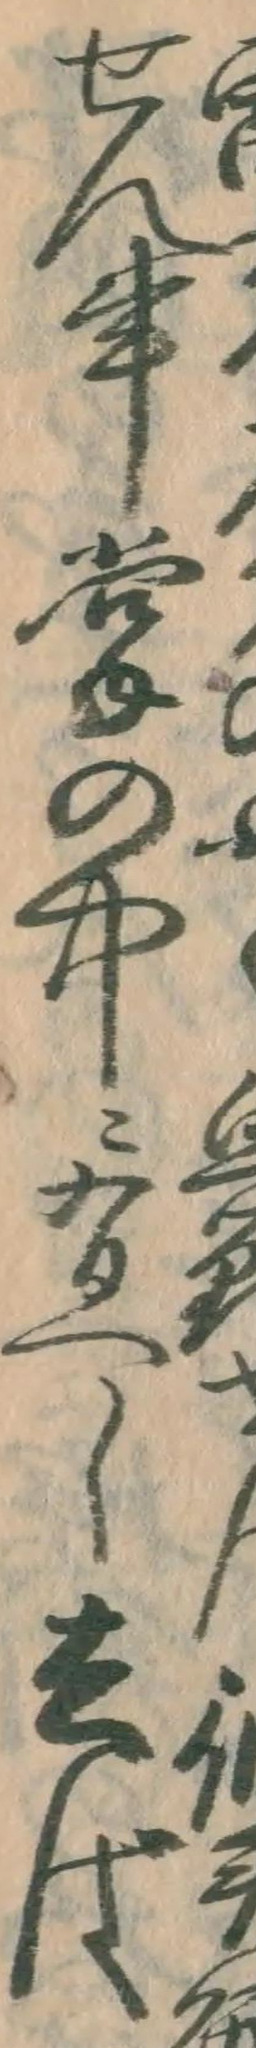せん事掌の中ニ有へし去ば

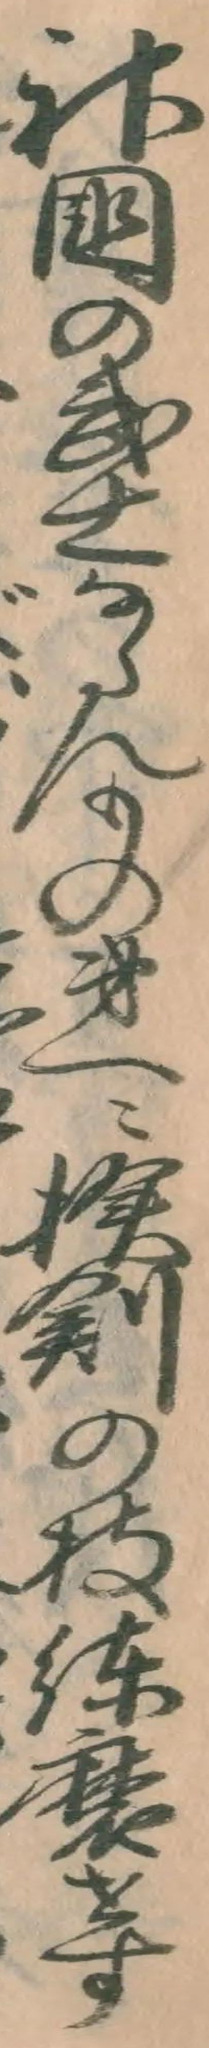神国の武士ならんもの第一ニ槍剣の技錬磨せす
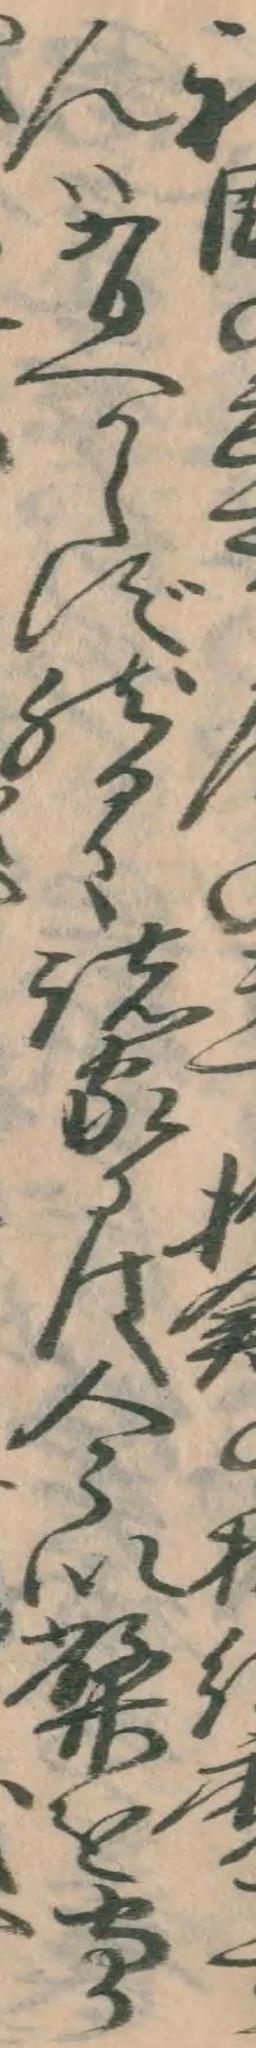んハ有へからず然るに諸家には今以て弊を守り
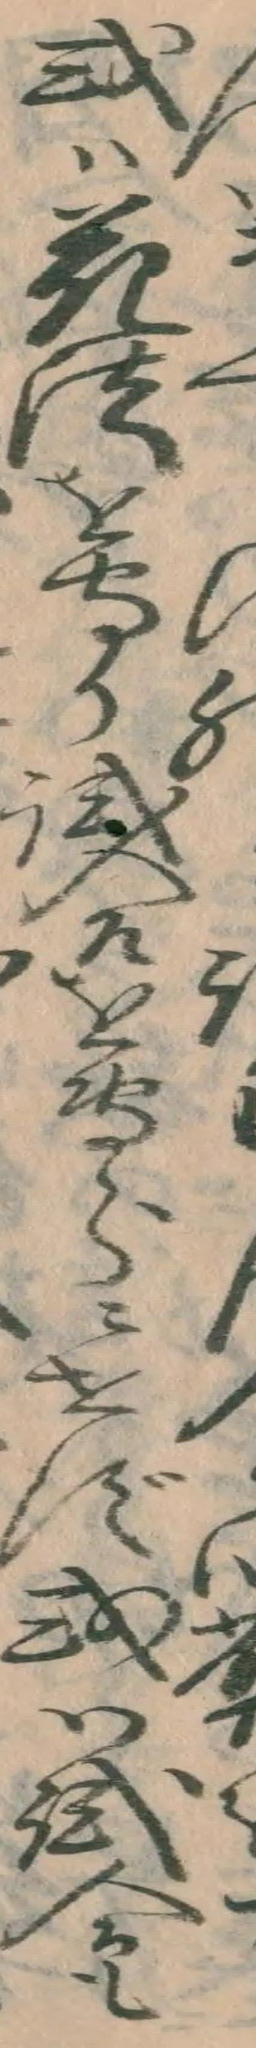或ハ花法を守り試合を専らニせず或ハ試合も
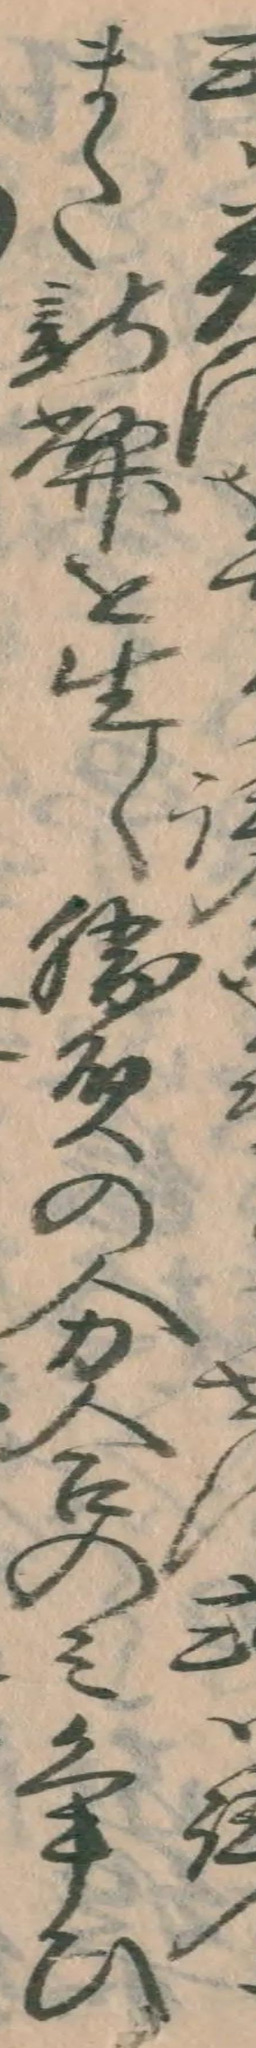また新弊を生し勝負の分合のミ争ひ
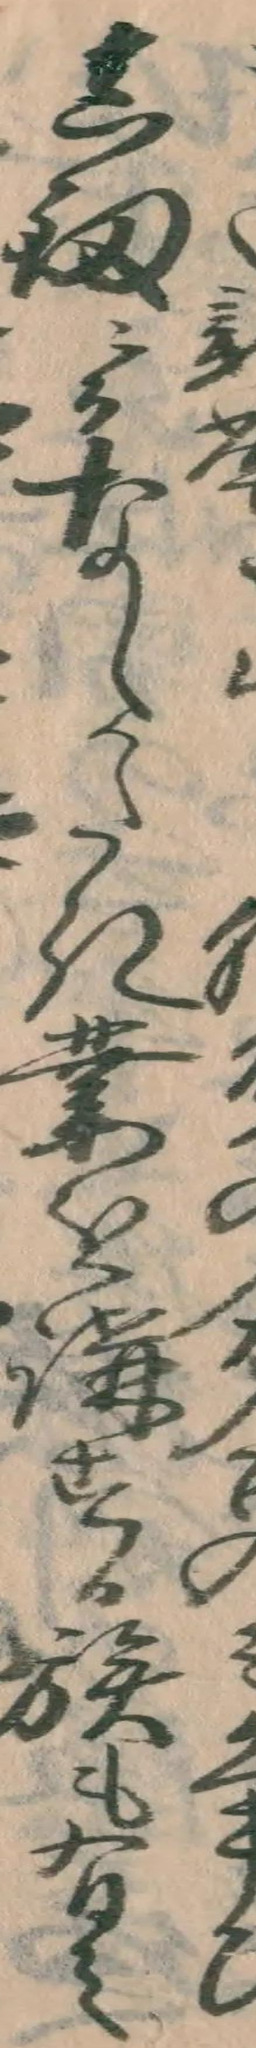真剱二而なしかたき業を講する族も有之
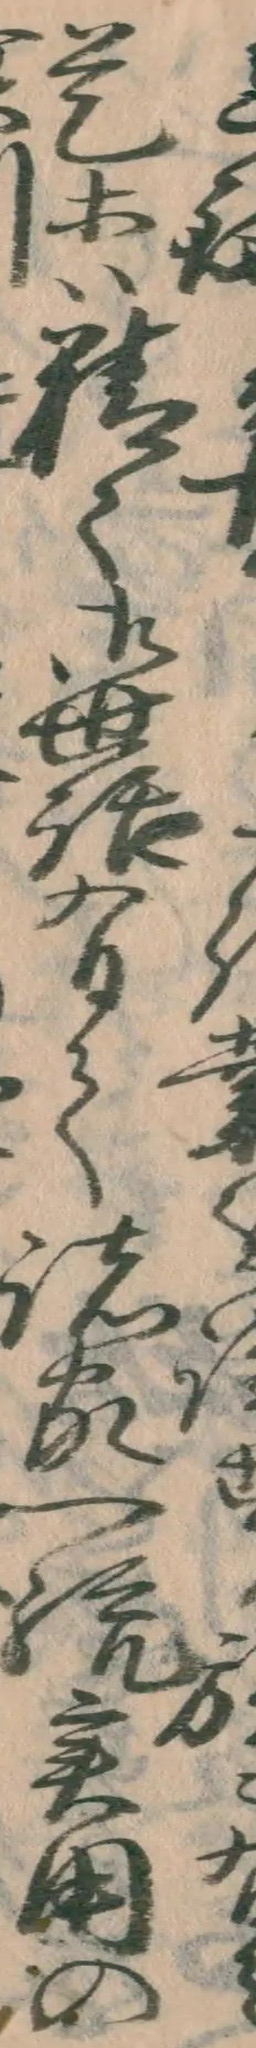是等ハ精々御世話有之諸家一統戦実用の
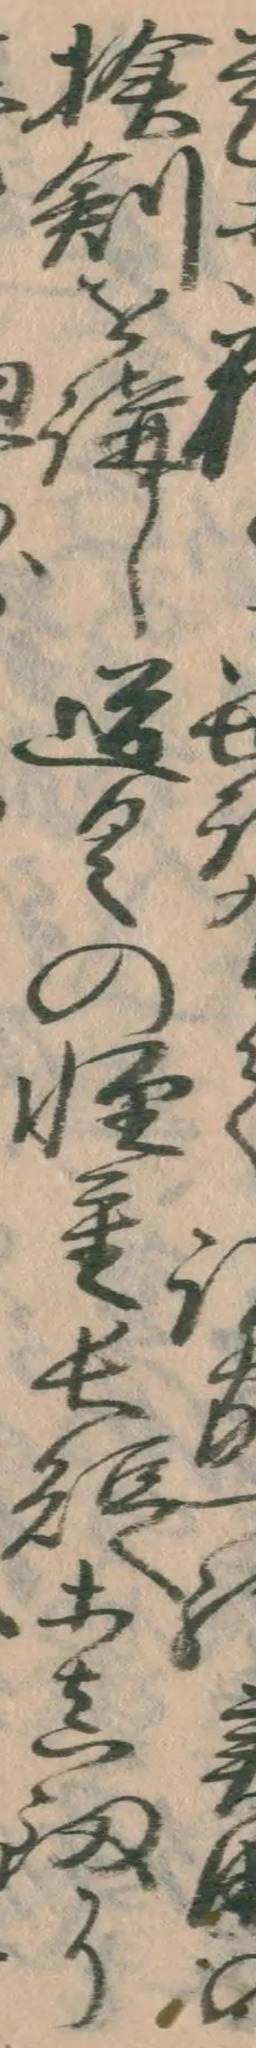槍剣を講し道具の軽重長短等真剱に
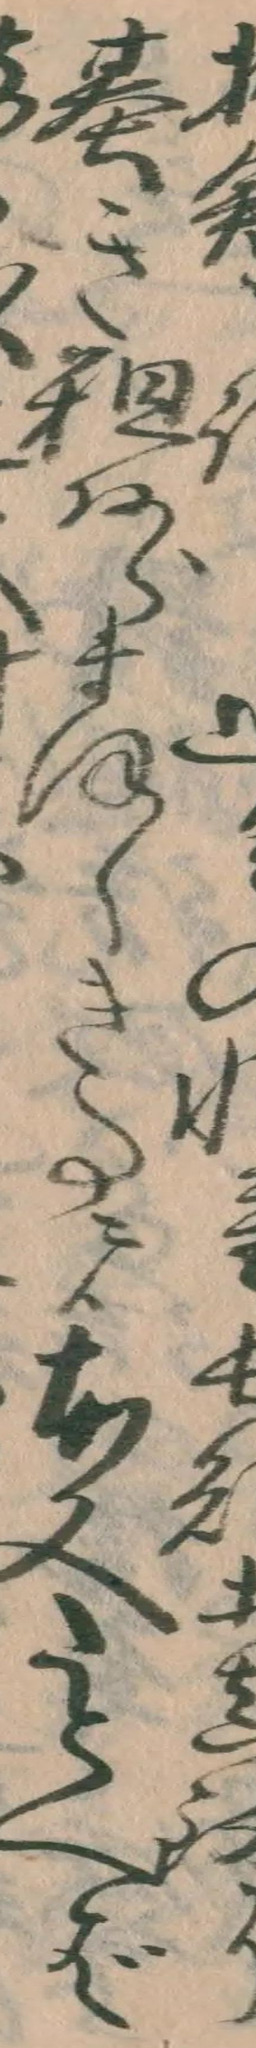基き粗あらまほしき事ニ候本文たとへば
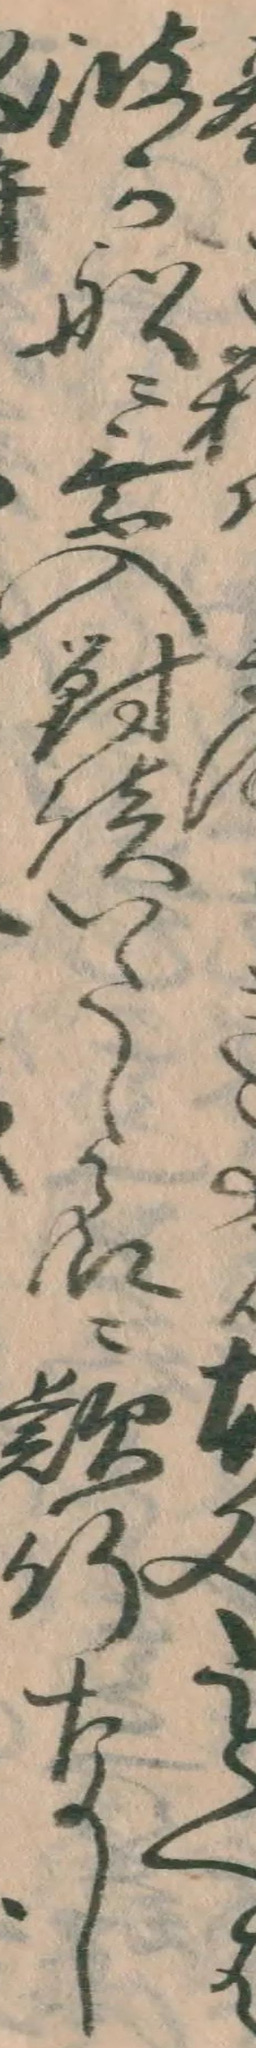彼か船ニ乗入對談いたし候様ニ欺行なし
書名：麗斎叢書. 20
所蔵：国立国会図書館 National Diet Library, JAPAN
